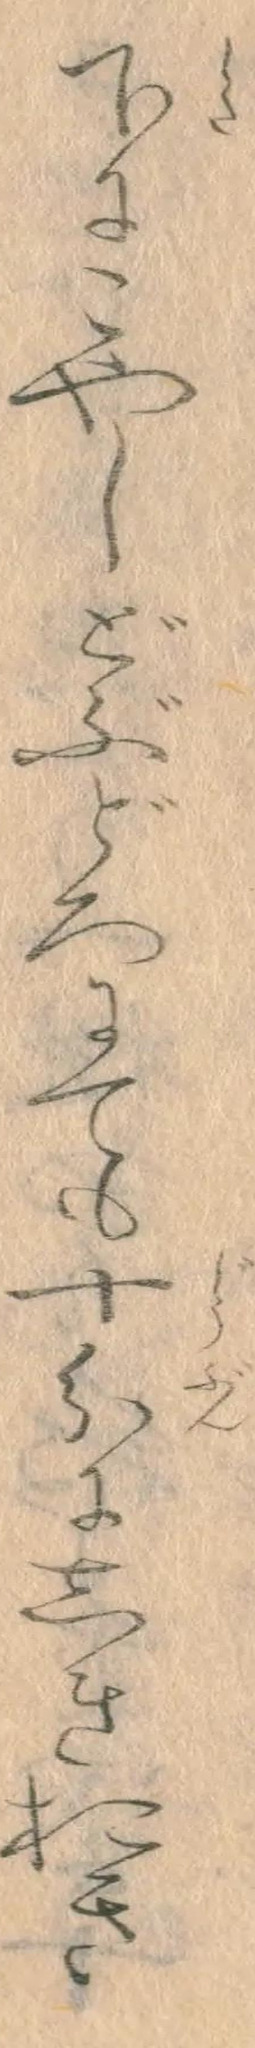下にこやしどぶどろにても十分にしきおき
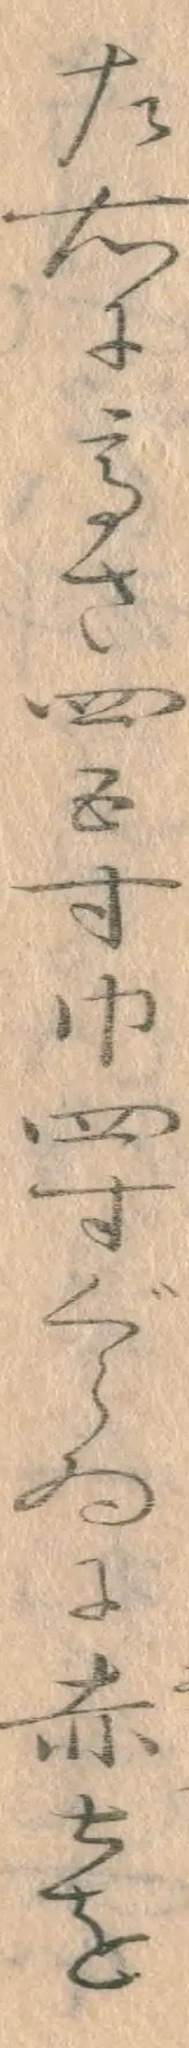左右に高さ四五寸巾四寸ぐらゐに赤土を
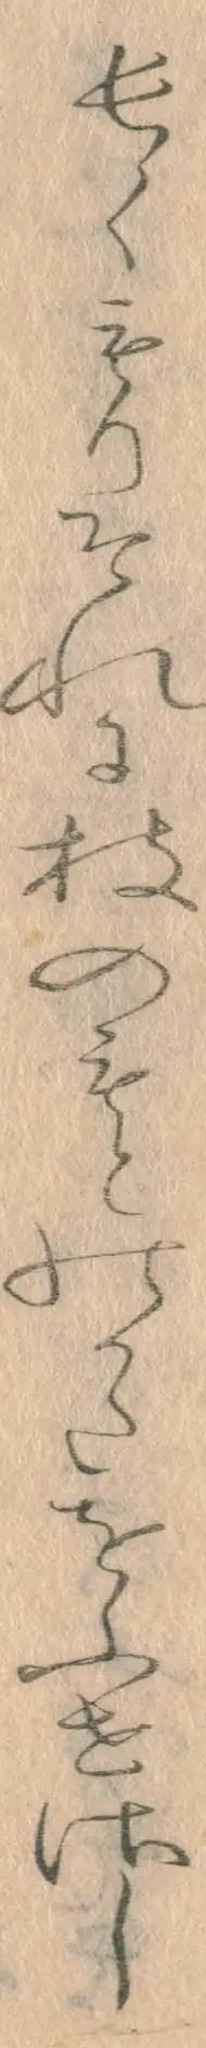長くもりそれに枝のもとのかたをふせさし
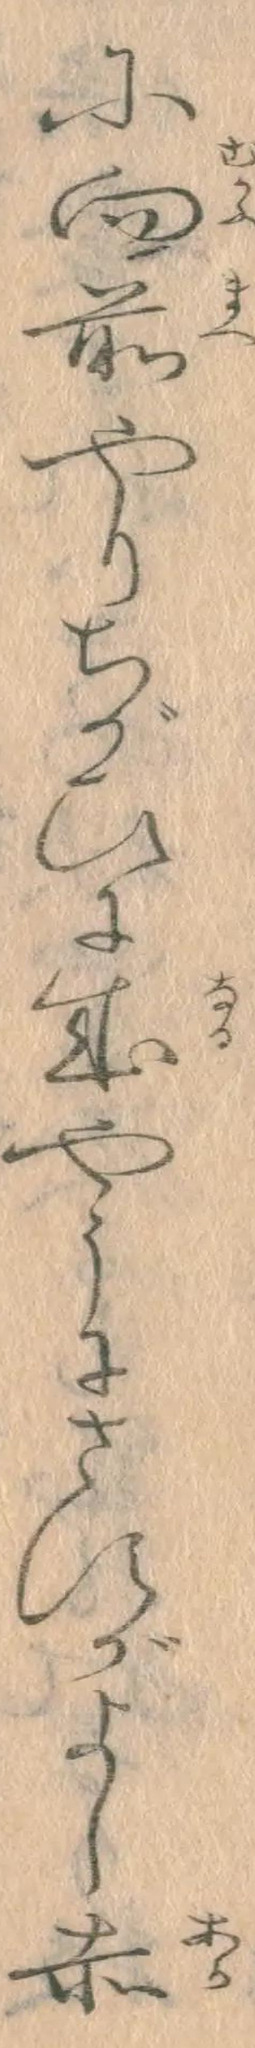に向前やりちがひに成やうにさすがよし赤
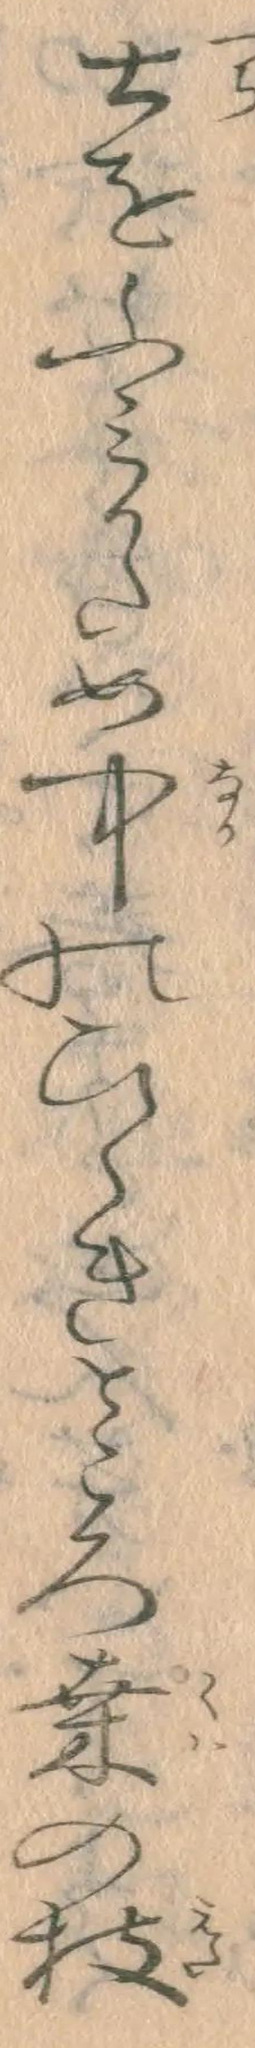土をしつみかため中のひらきところ桑の枝
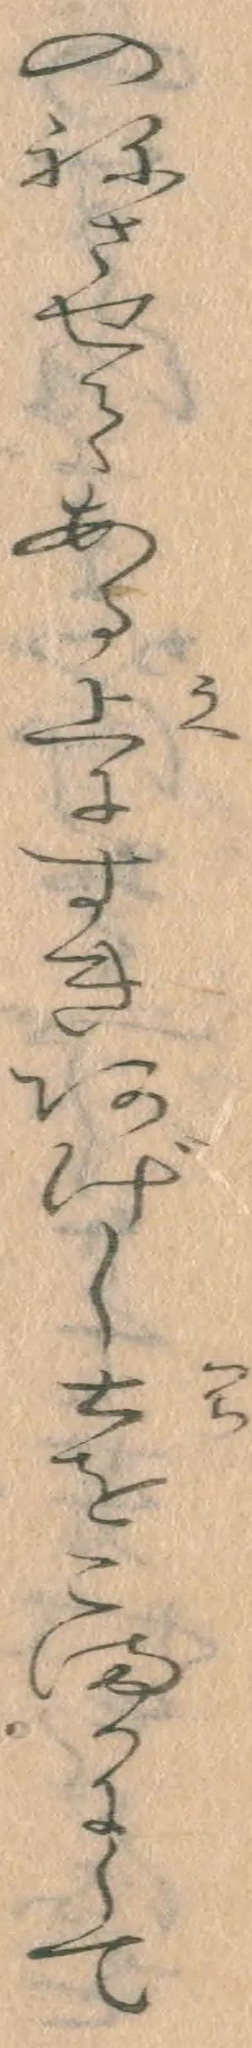のねさせてある上にすきあげし土をこまかにして
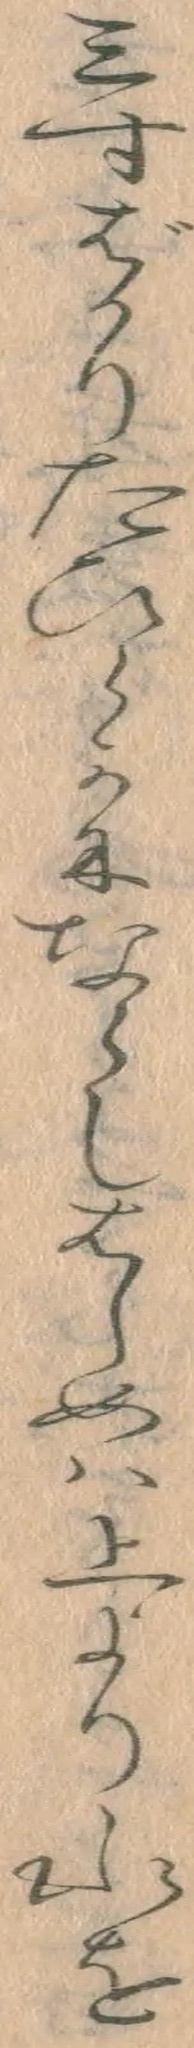三寸ばかりたひらかにならしはしめは上より水を
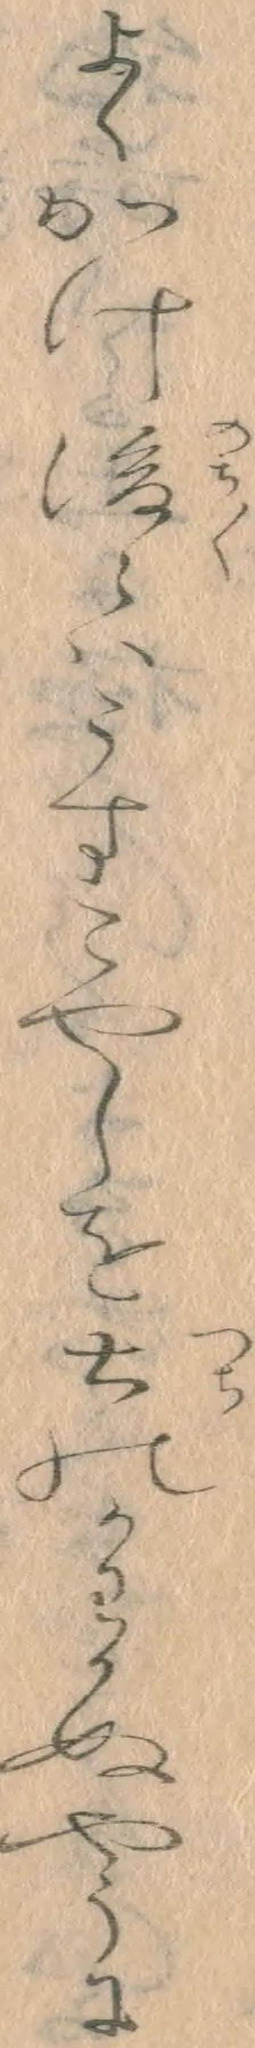よくかけ後々はうすこやしを土のかわかぬやうに
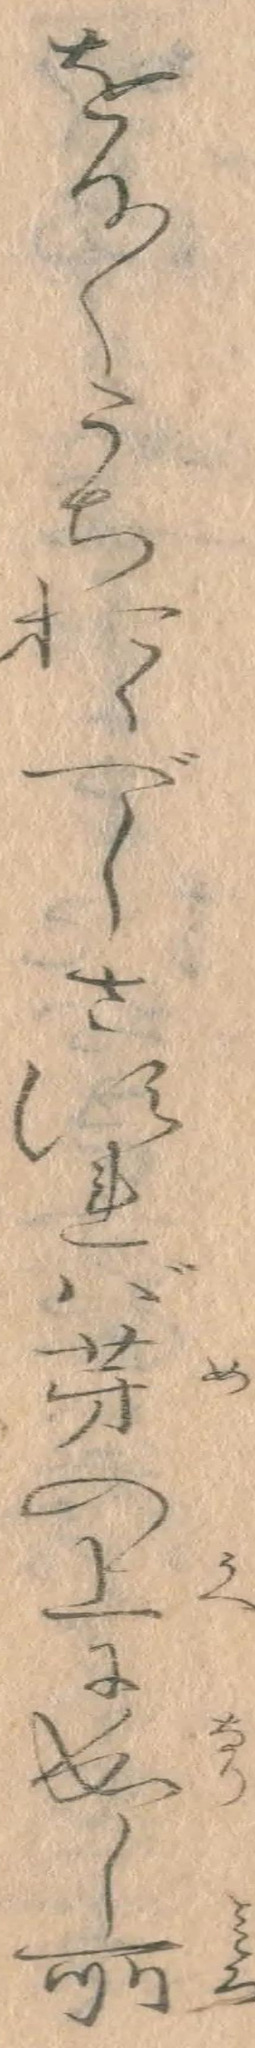おほくうちおくべしさすれば芽の上に成し所
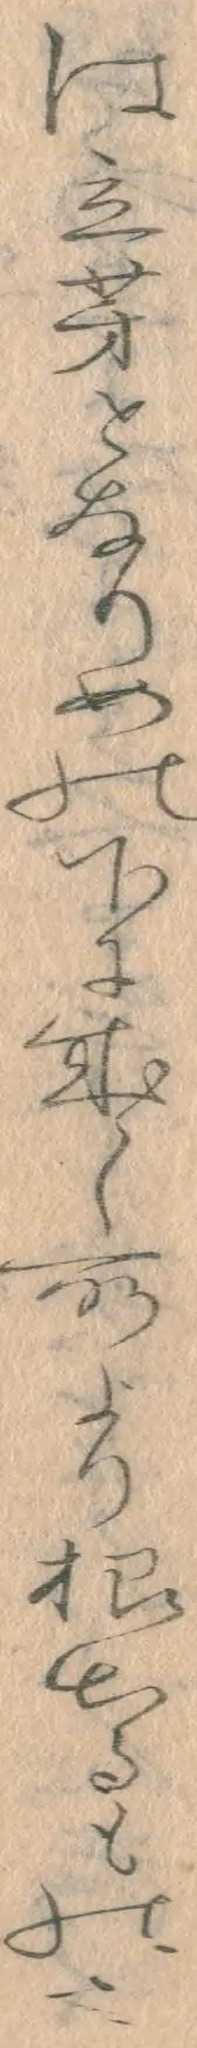は立芽となりめの下に成し所より根出るもの成り
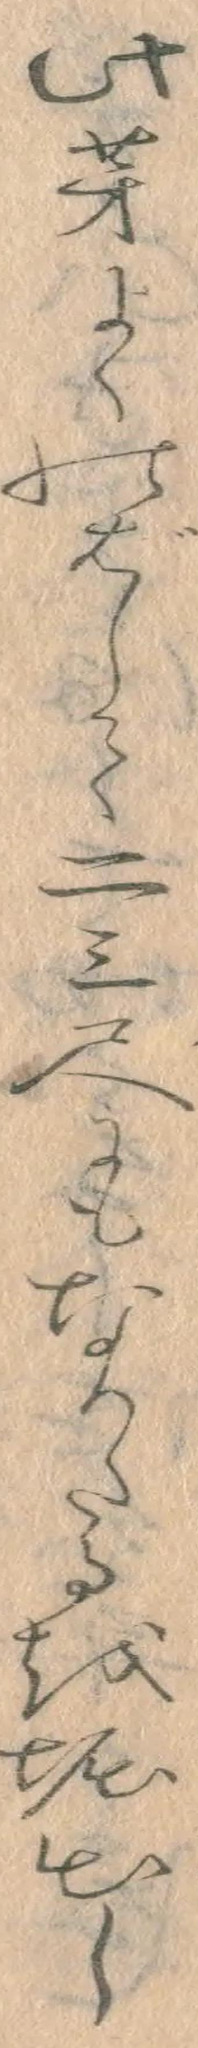此芽よくのばして二三尺にもなりたるを堀出し
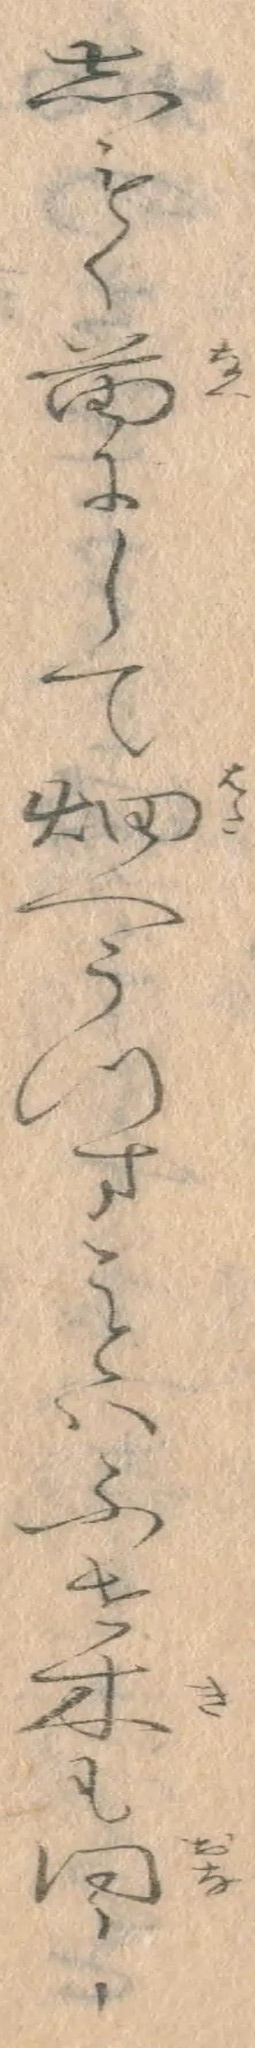しもく苗にして畑へうつすことはふせ木も同し
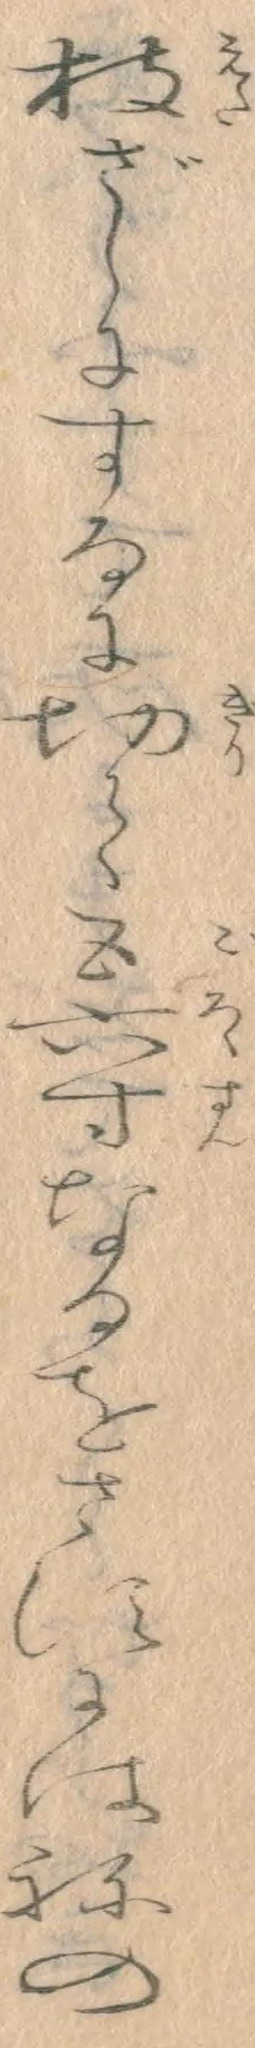枝ざしにするに切て五六寸なるをさすにはねの
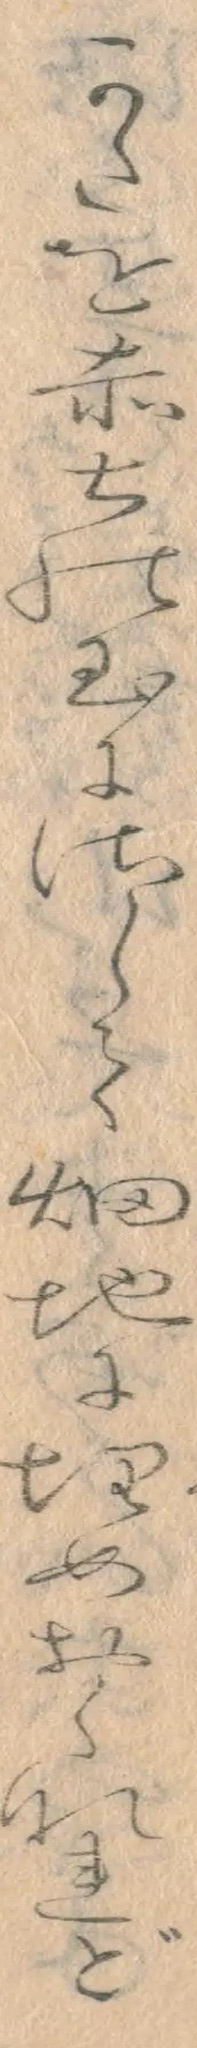かたを赤土の玉にさして畑地に埋めおくなれど
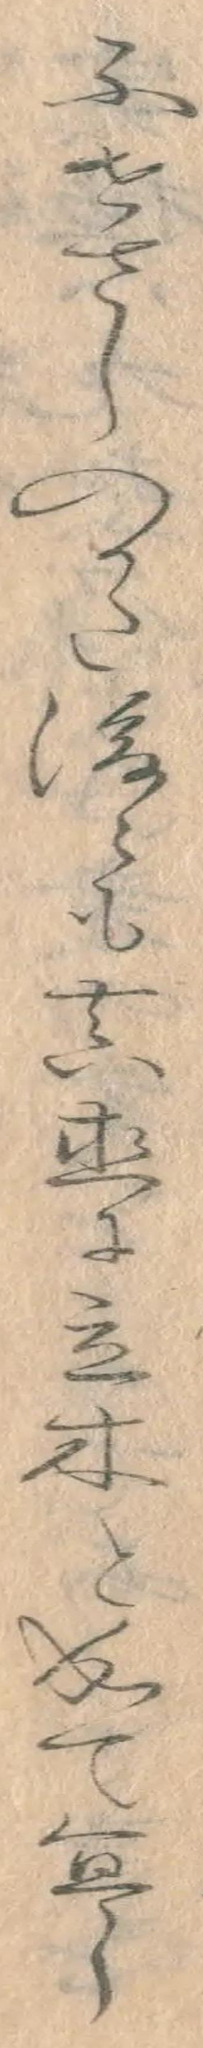ふせさしのかた後々も真直に立木と成て宜し

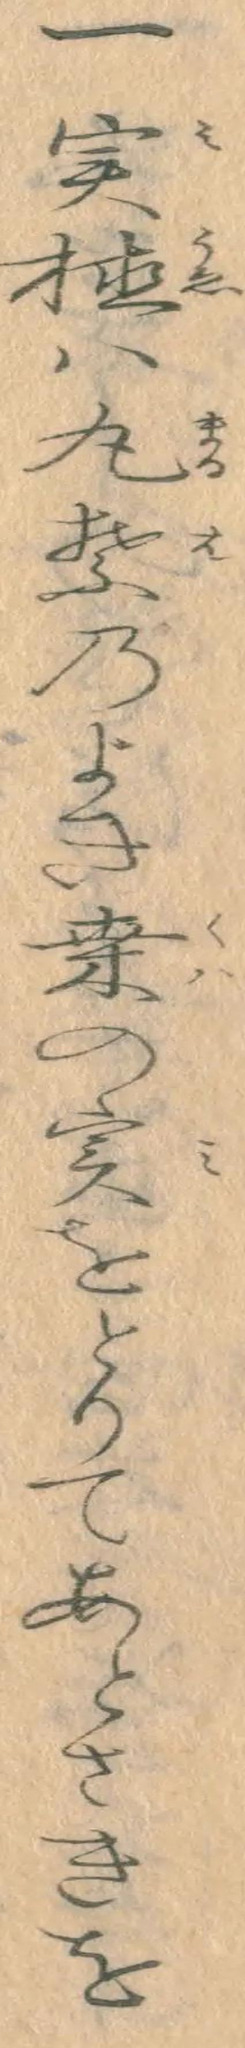一実植は丸葉のよき桑の実をとりてあとさきを
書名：蚕茶并紙木植方書
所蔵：国立国会図書館 National Diet Library, JAPAN
